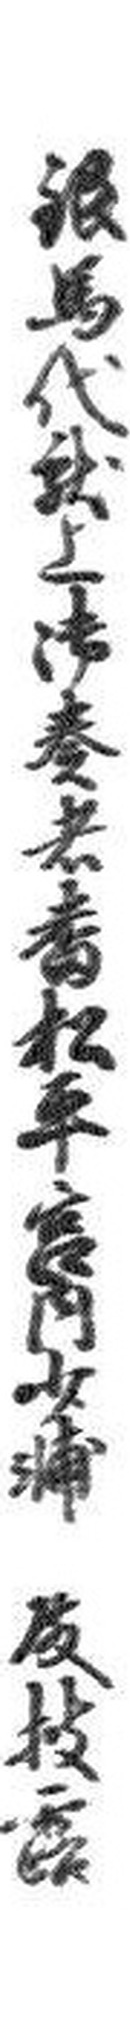銀馬代献上御奏者番松平宮内少輔殿披露
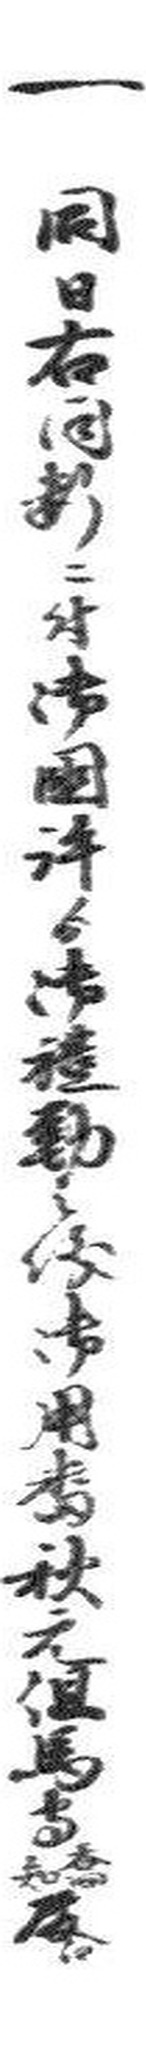一同日右同断ニ付御国許ゟ御礼勤之儀御用番秋元但馬守喬知殿江

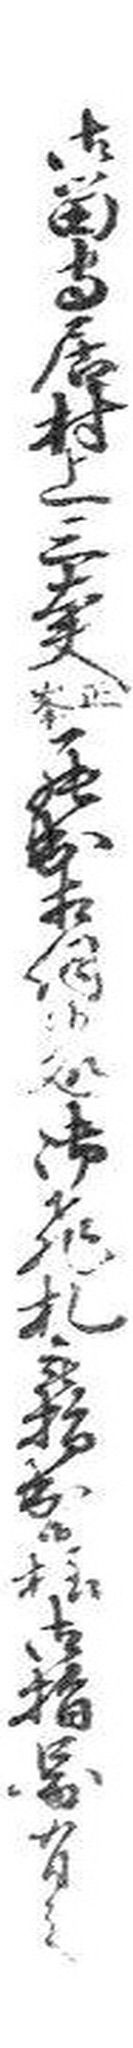御留守居村上三大夫正峯罷出相伺候処御飛札被指出候様御指図有之
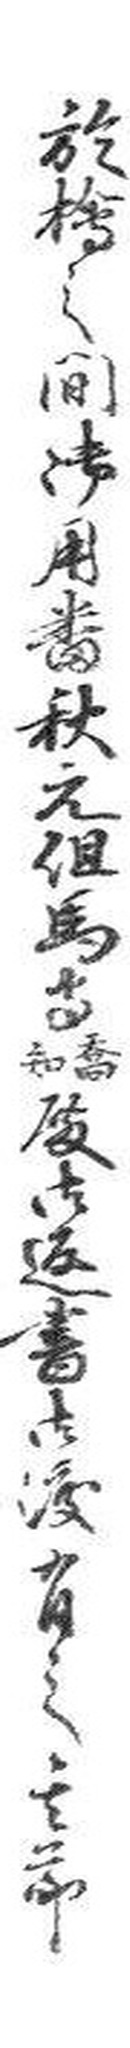於桧之間御用番秋元但馬守喬知殿御返書御渡有之其節
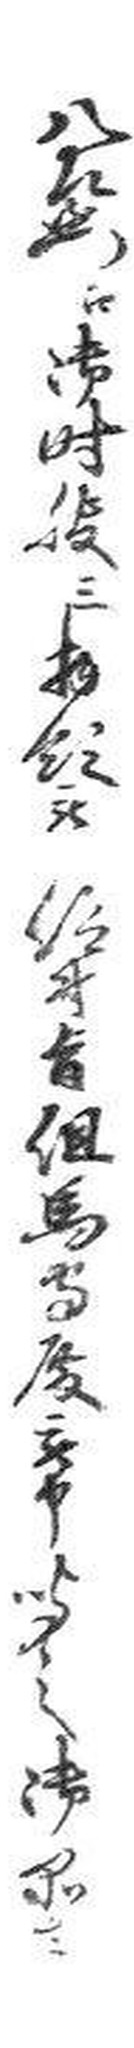八左衛門江御時服三拝領被仰付旨但馬守殿被申聞之御品者
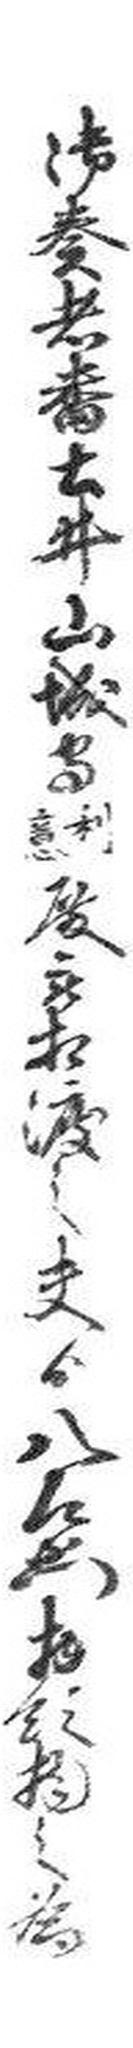御奏者番土井山城守利意殿被相渡之夫ゟ八左衛門拝領物之為
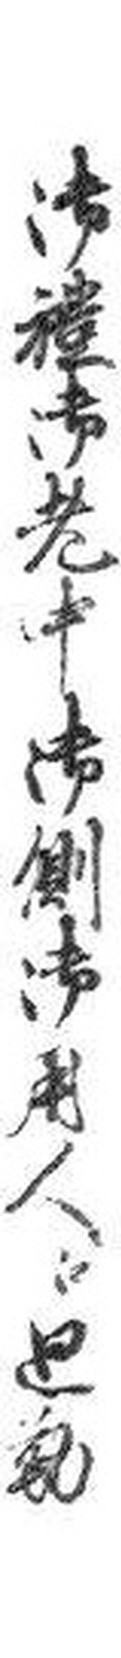御礼御老中御側御用人江廻勤
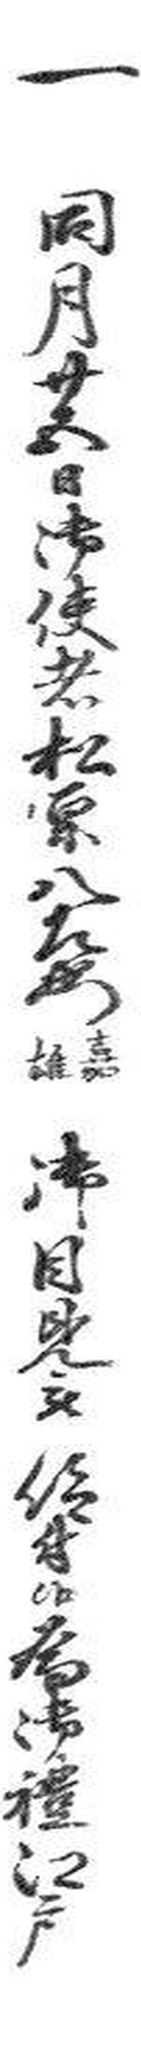一同月廿五日御使者松原八左衛門嘉雄御目見被仰付候為御礼江戸
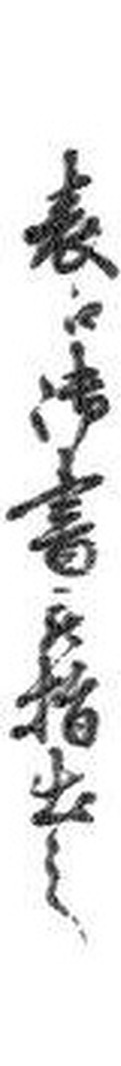表江御書被指出之
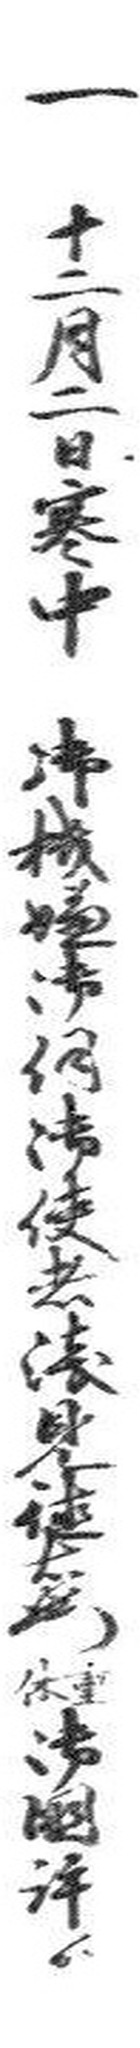一十二月二日寒中御機嫌御伺御使者浅見徳右衛門重休御国許ゟ
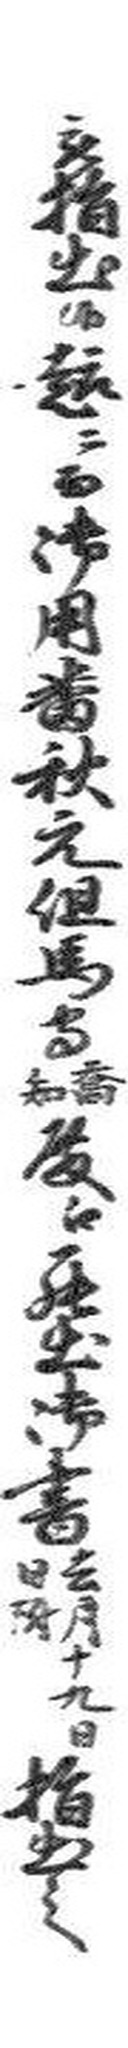被指出候趣ニ而御用番秋元但馬守喬知殿江罷出御書去月十九日日付指出之
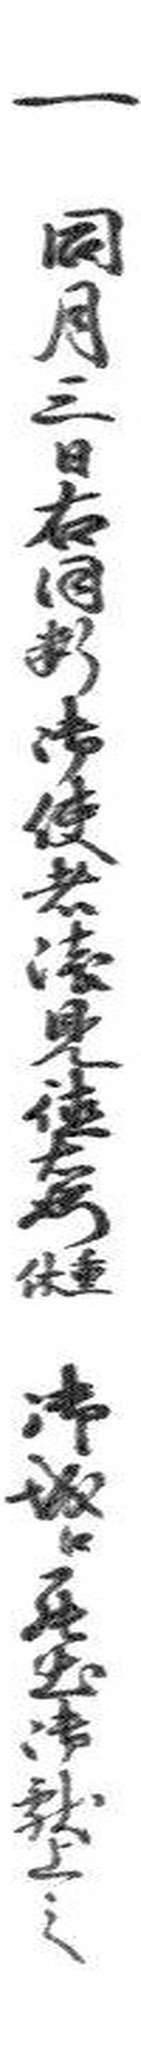一同月三日右同断御使者浅見徳右衛門重休御城江罷出御献上之
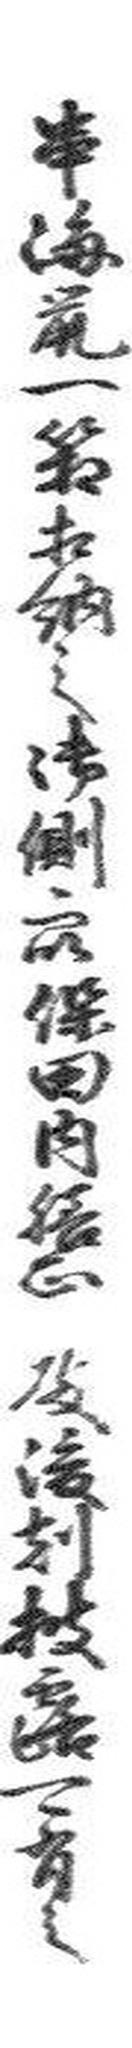串海鼠一箱相納之御側衆保田内膳正殿後刻披露可有之
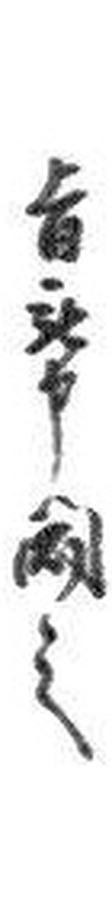旨被申聞之
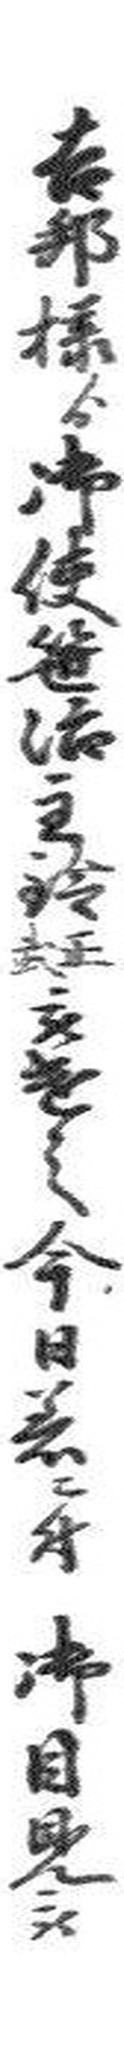吉邦様ゟ御使笹治主鈴正武被遣之今日着ニ付御目見被
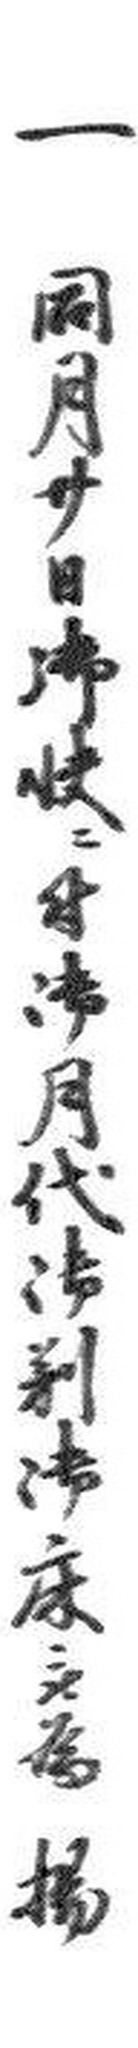一同月廿日御快ニ付御月代御剃御床被為揚
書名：家譜 二十六 吉品公 従宝永七年到正徳二年
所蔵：福井県文書館 Fukui Prefectural Archives
